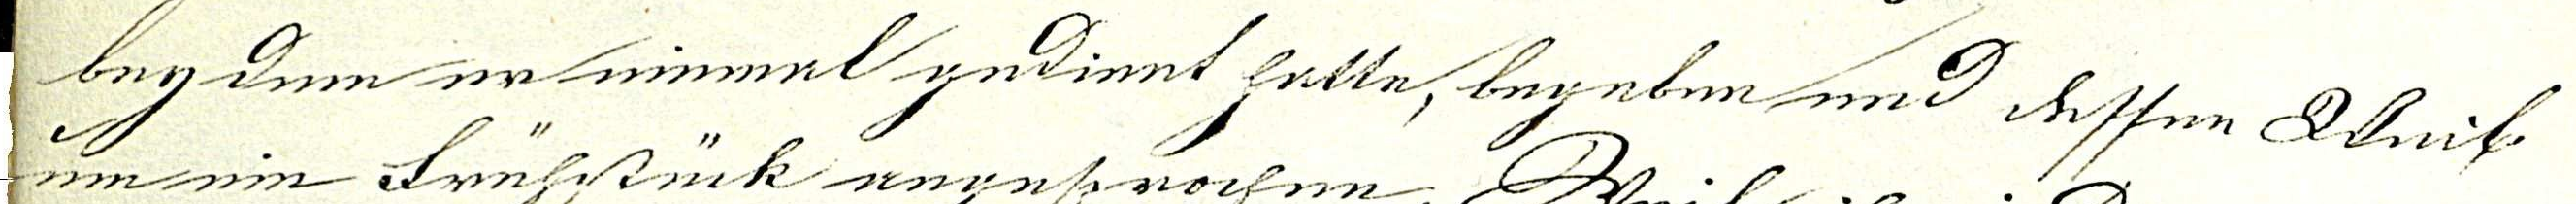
bey dem er einmal gedient hatte, begeben und dessen Weib
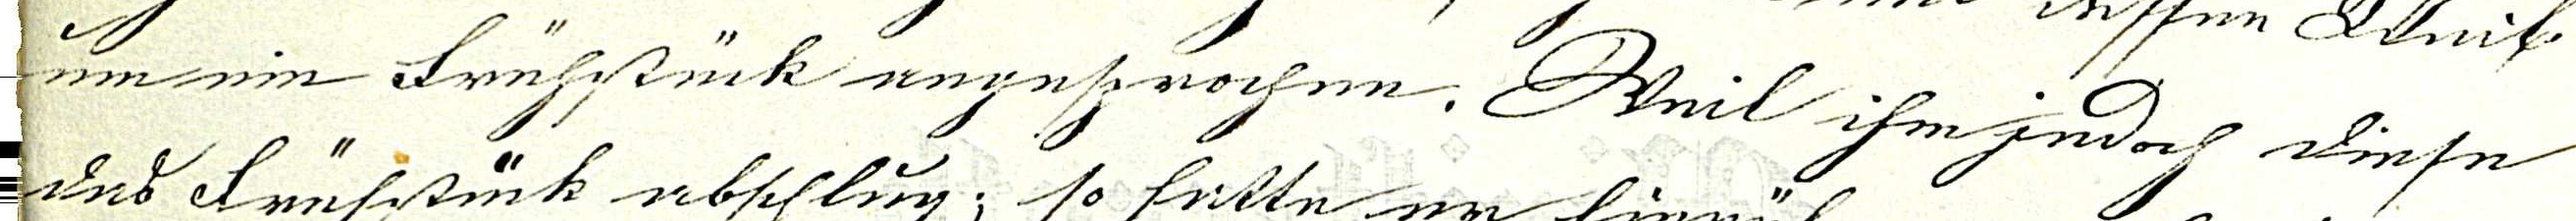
um ein Frühstück angesprochen. Weil ihm jedoch diese
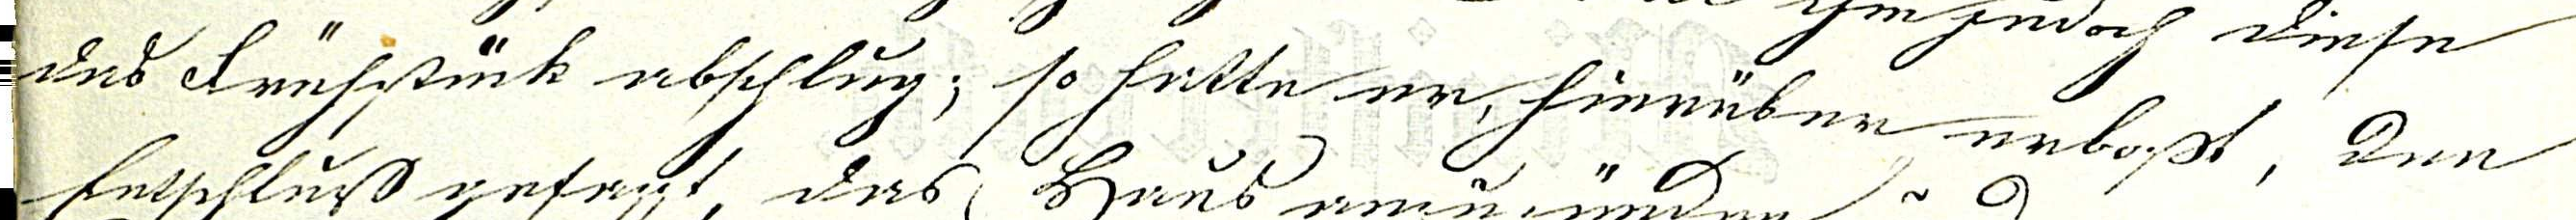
das Frühstück abschlug; so hatte er, hierüber erboßt, den
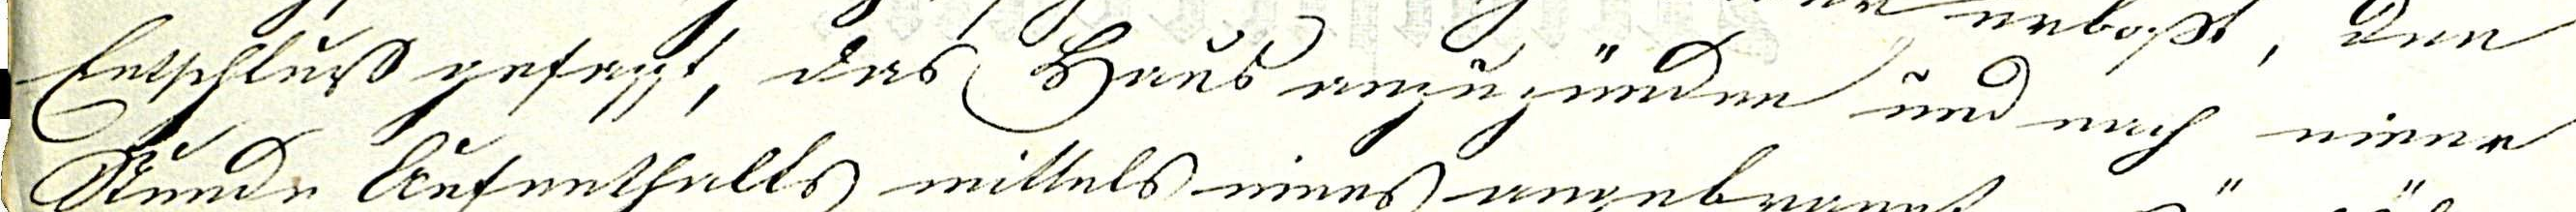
Entschluß gefasst, das Haus anzuzünden und nach einer
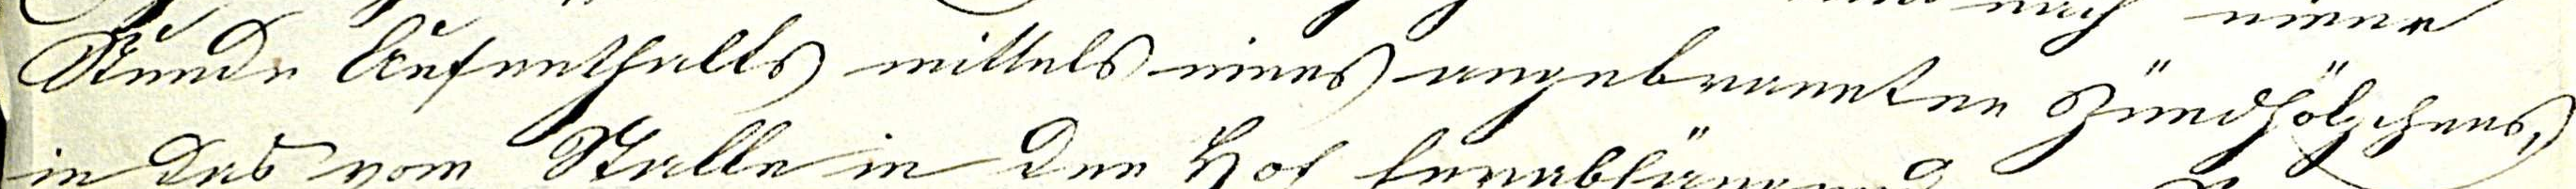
Stunden Aufenthalte mittels eines angebrannten Zündhölzchens,
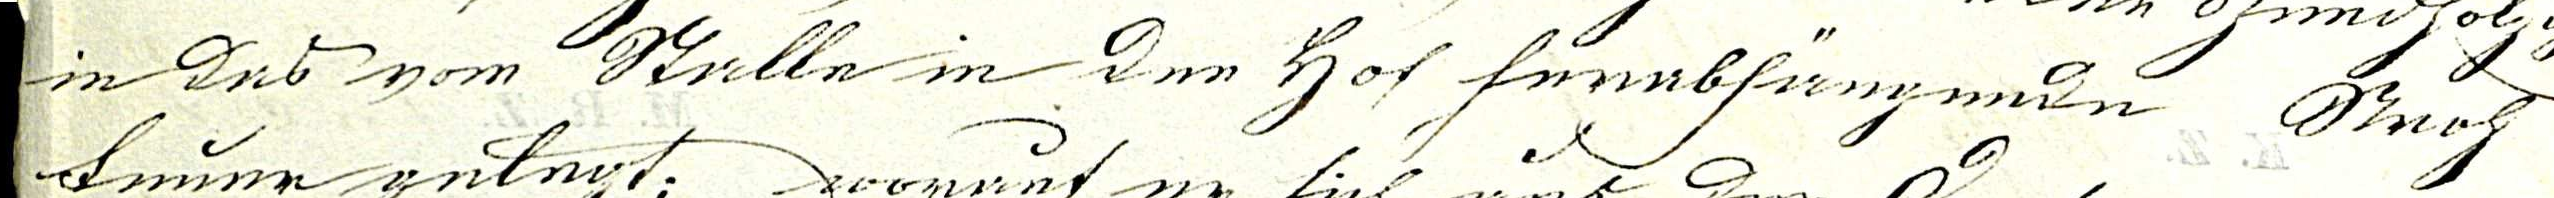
in das vom Stalle in den Hof herabhängende Stroh
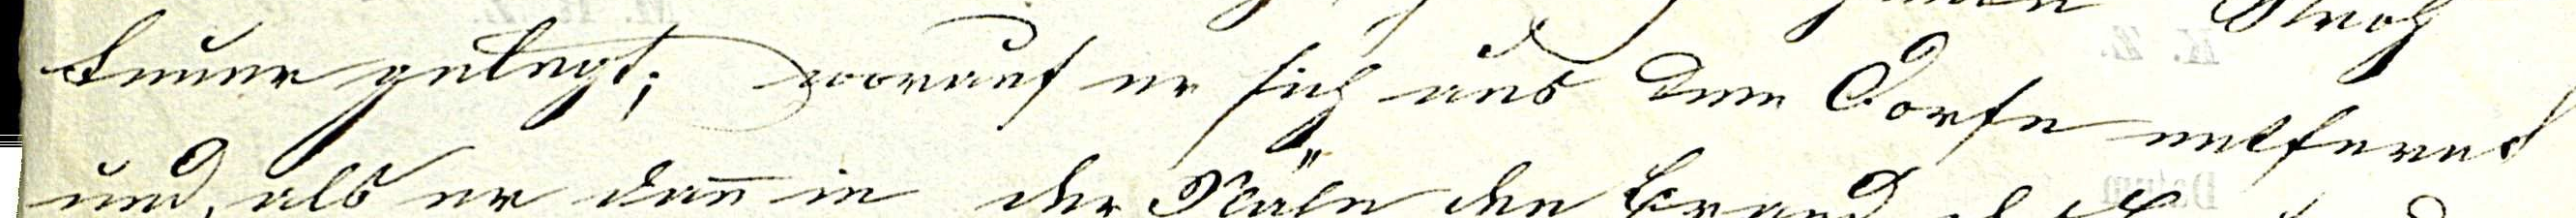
Feuer gelegt; worauf er sich aus dem Dorfe entfernt
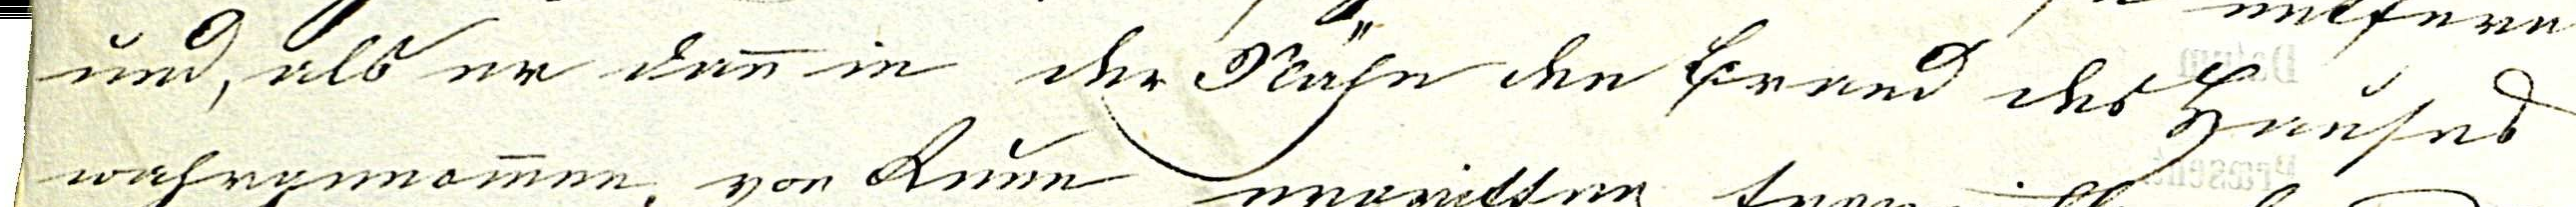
und, als er dann in der Nähe den Brand des Hauses
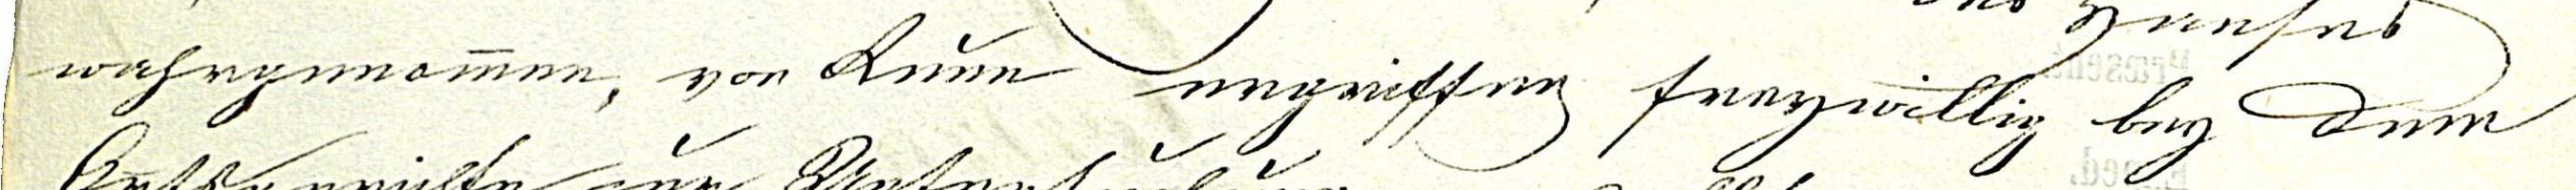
wahrgenommen, von Reue ergriffen freywillig bey dem
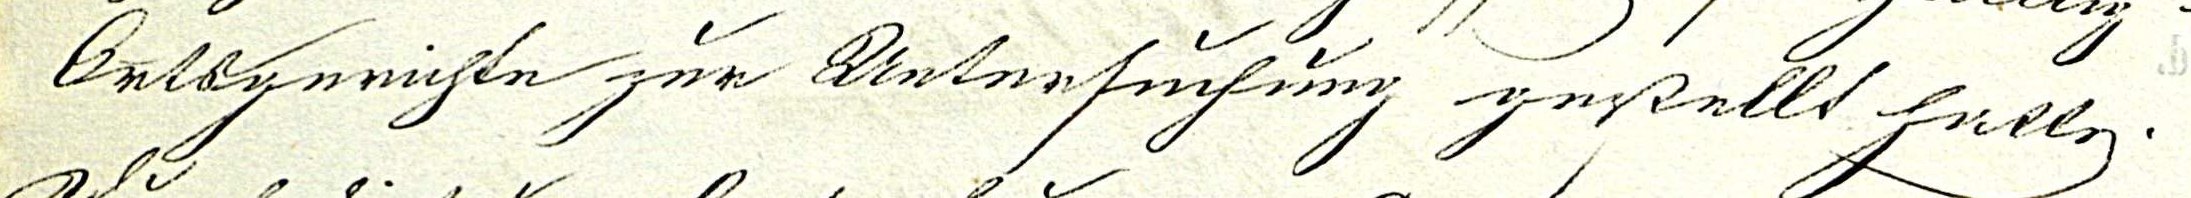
Ortsgerichte zur Untersuchung gestellt hatte.
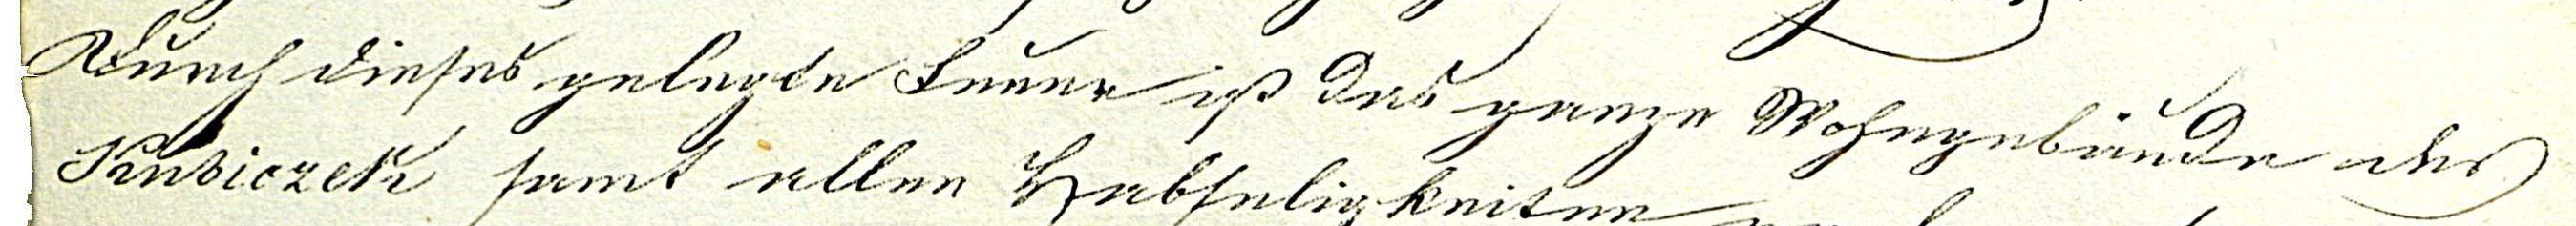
Durch dieses gelegte Feuer ist das ganze Wohngebäude des
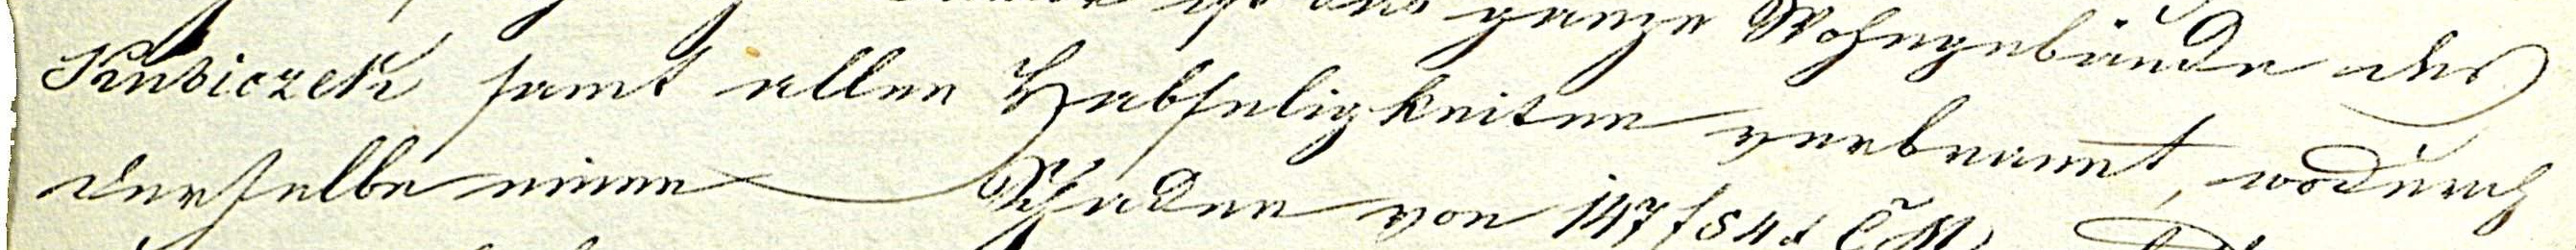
Kubiczek samt allen Habseligkeiten verbrannt, wodurch
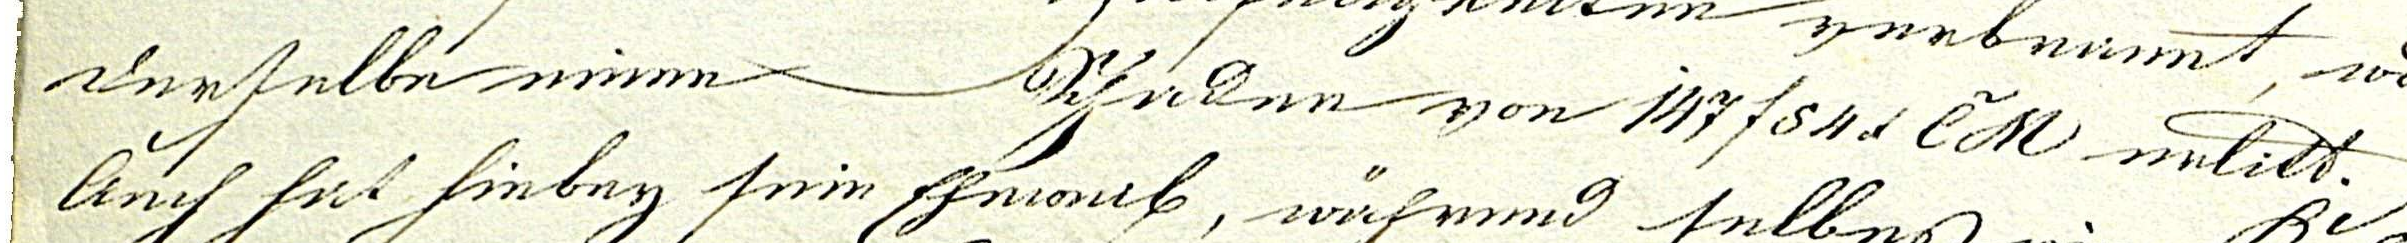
derselbe einen Schaden von 147f 54 x CM erlitt.
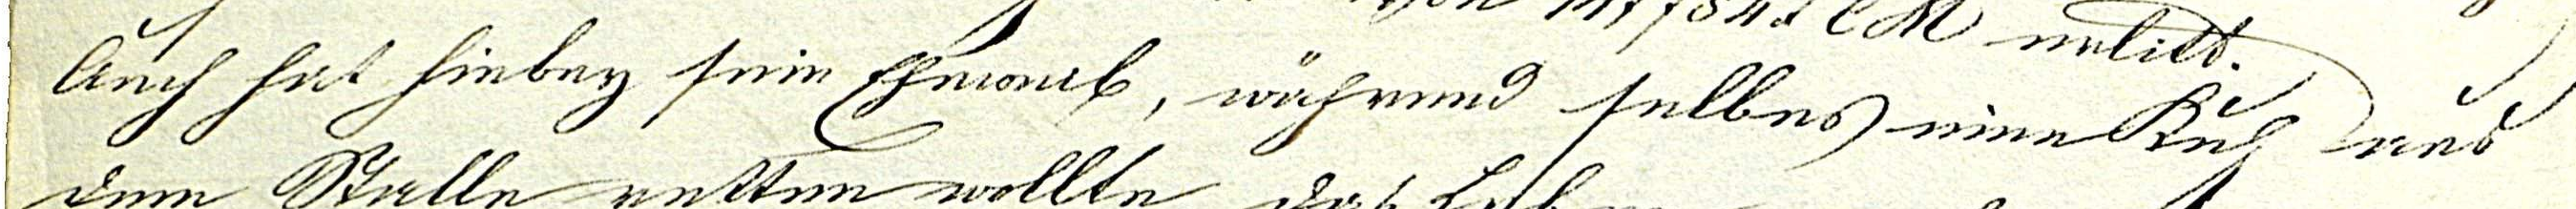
Auch hat hiebey sein Eheweib, während selbes eine Kuh aus
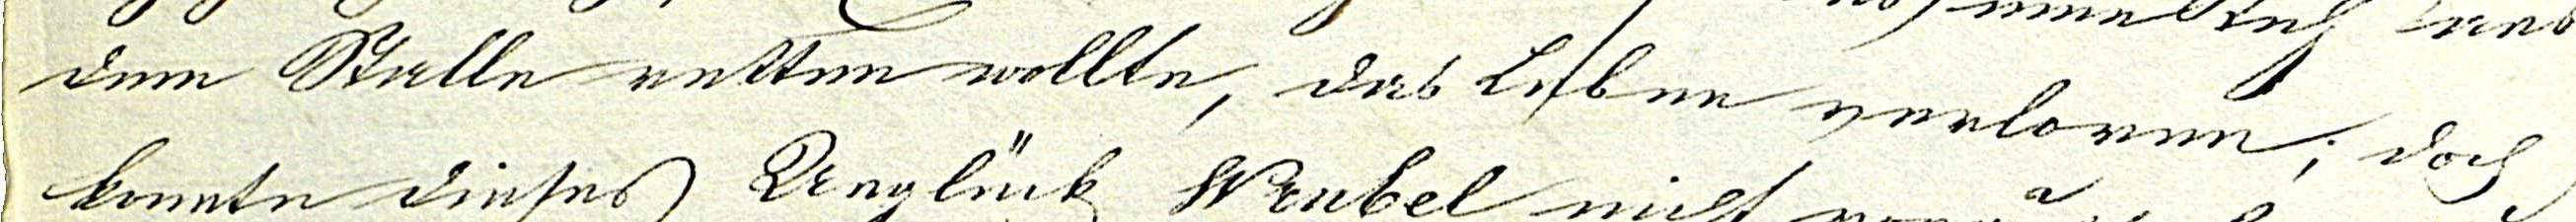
dem Stalle retten wollte, das Leben verloren; doch
